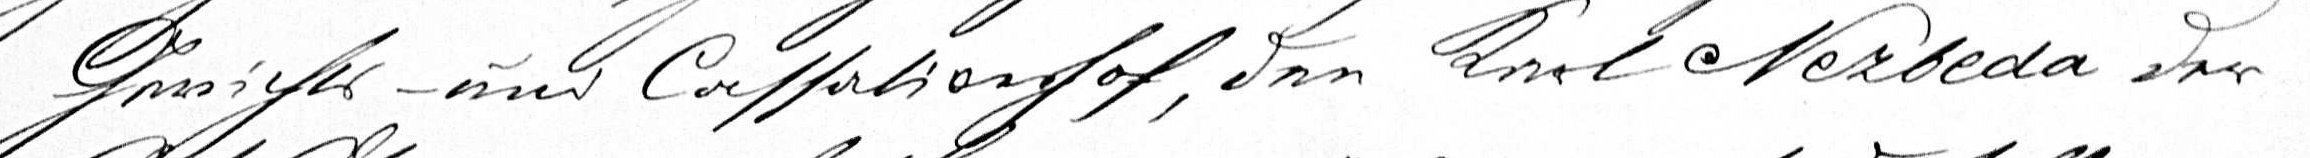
Gerichts- und Cassatioshof, den Karl Nezbeda der
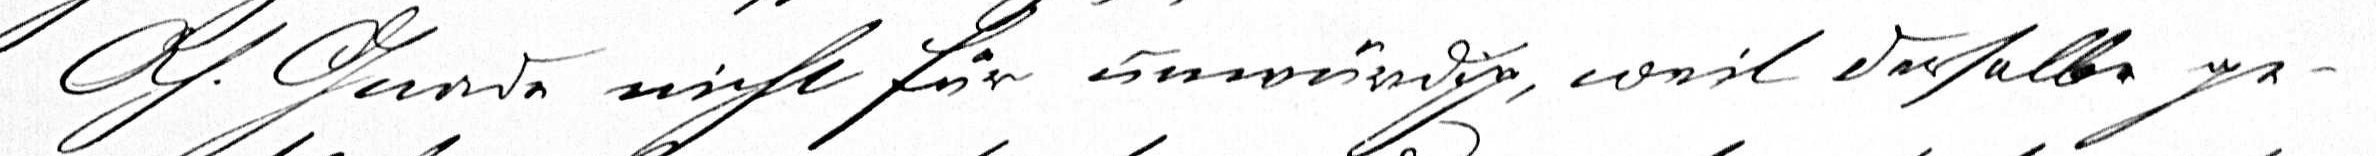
Ah. Gnade nicht für unwürdig, weil derselbe ge¬
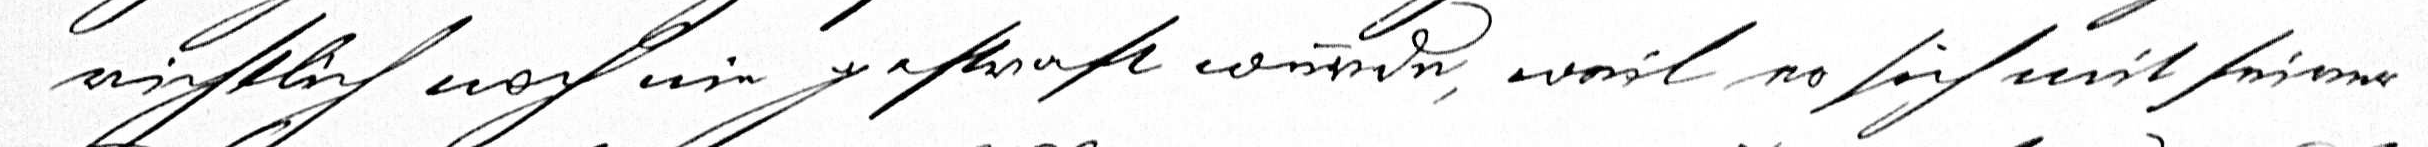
richtlich noch nie gestraft wurde, weil er sich mit seiner
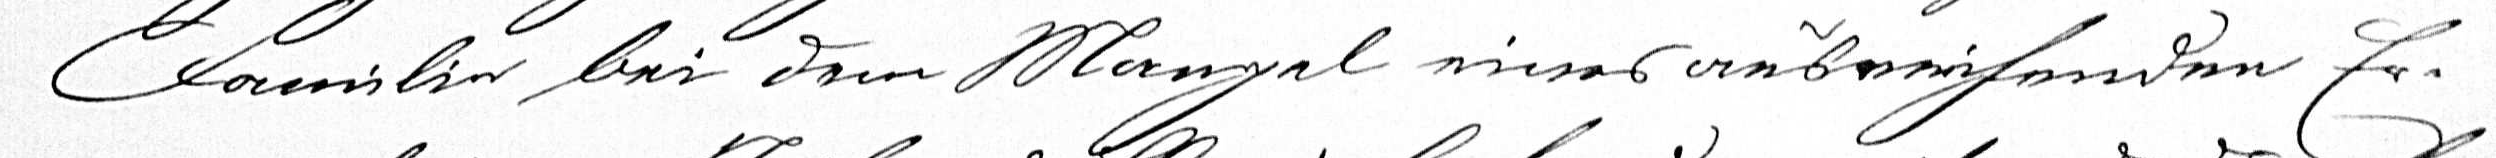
Familie bei dem Mangel eines ausreichenden Er¬
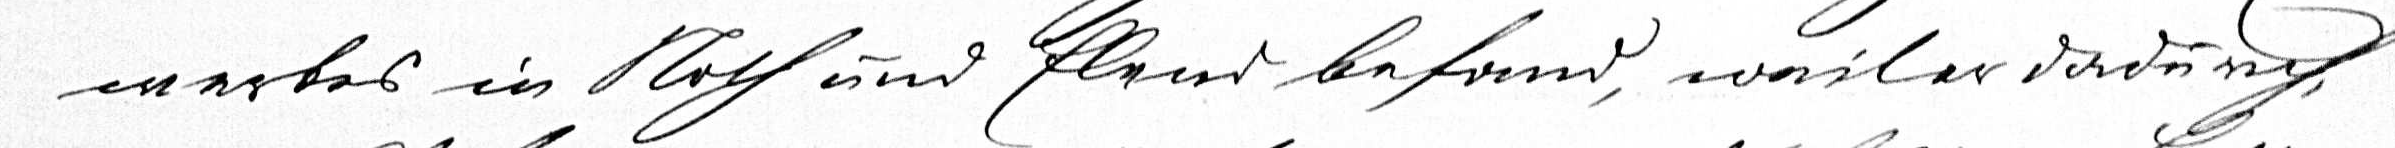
werbes in Noth und Elend befand, weil er dadurch,
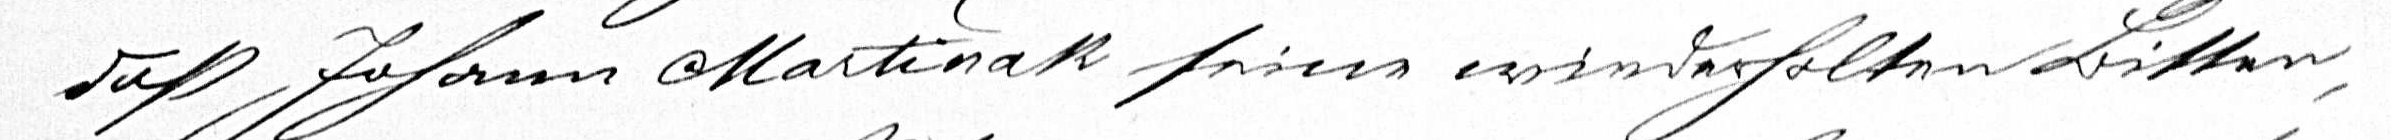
daß Johann Martinak seine wiederholten Bitten,
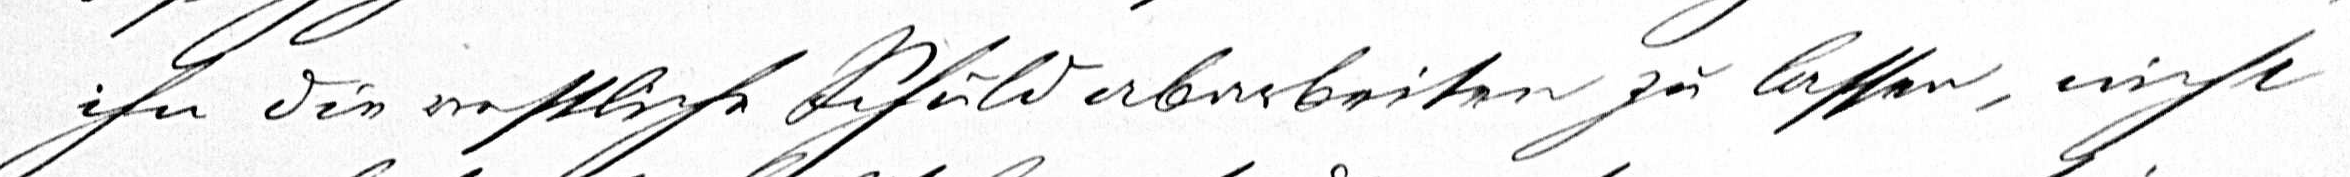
ihn die restliche Schuld abarbeiten zu lassen, nicht
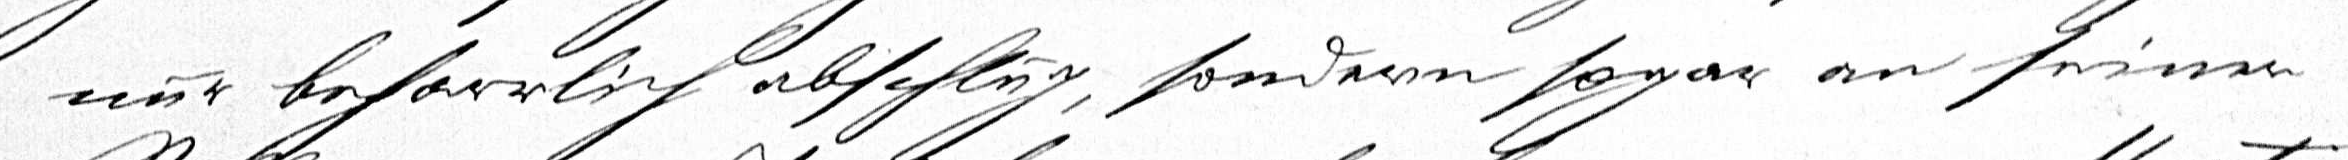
nur beharrlich abschlug, sondern sogar an seinen
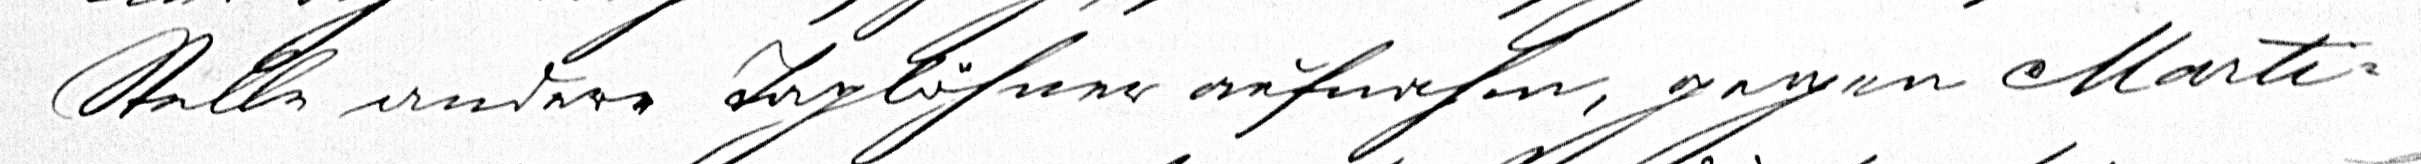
Stelle andere Taglöhner aufnahm, gegen Marti¬
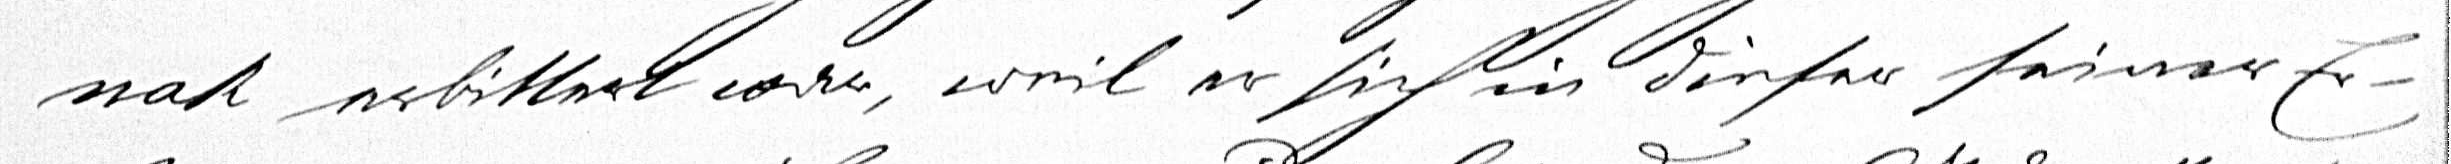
nak erbittert war, weil er sich in dieser seiner Er¬
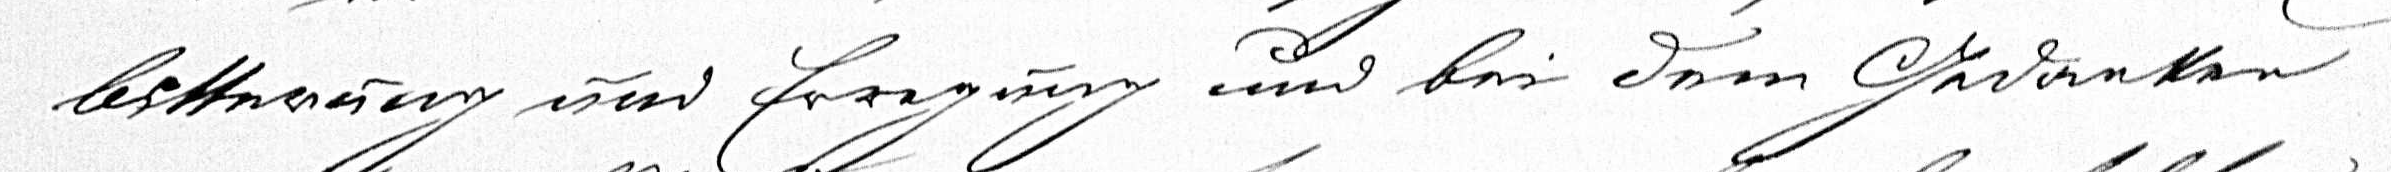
bitterung und Erregung und bei dem Gedanken
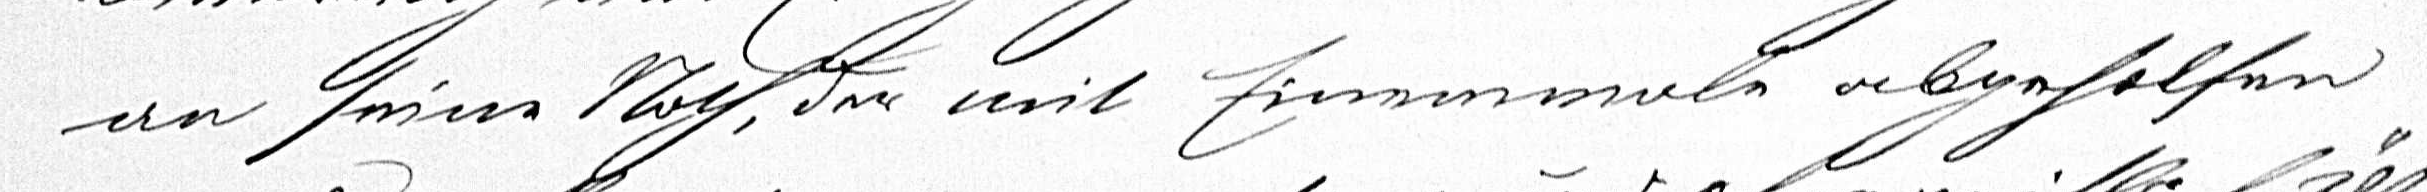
an seine Noth, der mit Einemmale abgeholfen
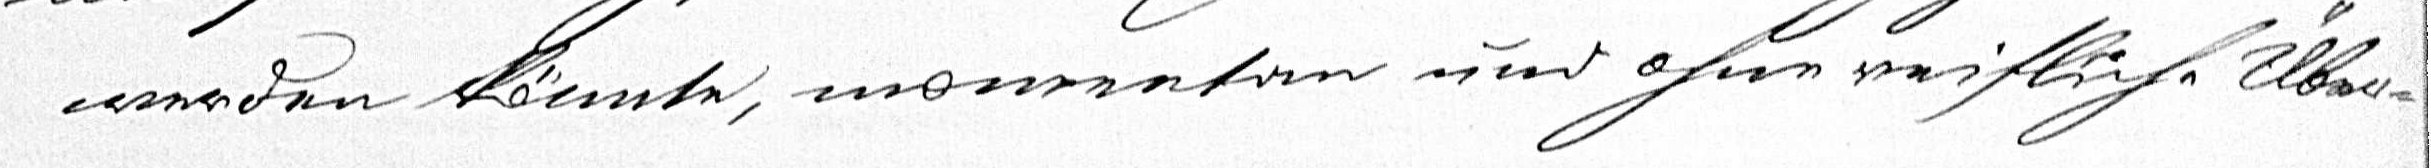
werden könnte, momentan und ohne reifliche Über¬
